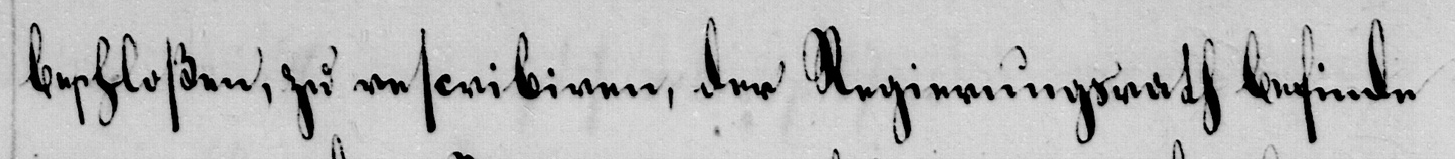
beschloßen, zu rescribiren , der Regierungsrath befinde
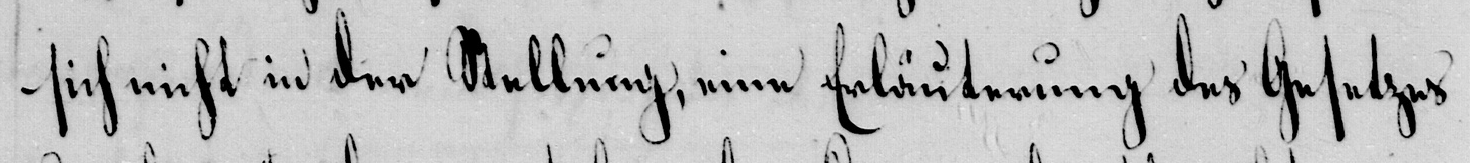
sich nicht in der Stellung, eine Erläuterung des Gesetzes
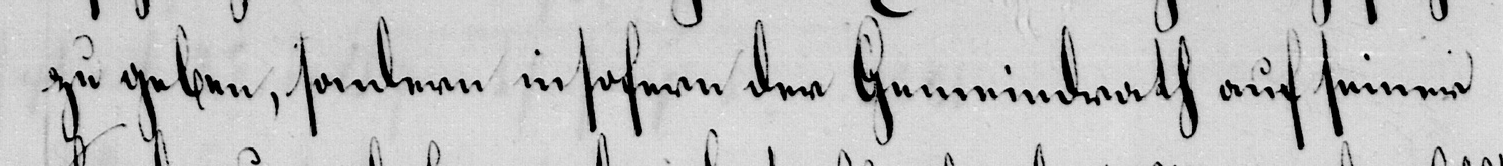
zu geben, sondern insofern der Gemeindrath auf seiner
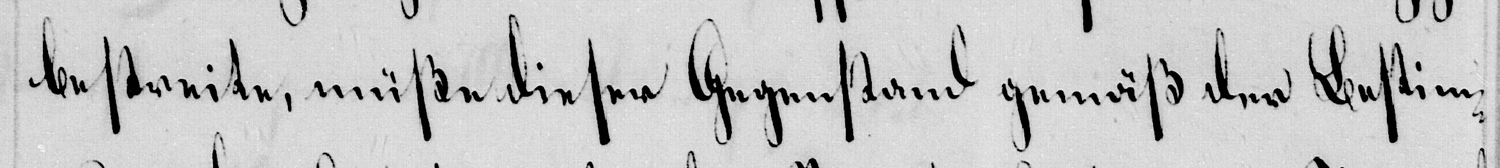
bestreite, müße dieser Gegenstand gemäß der Bestim¬
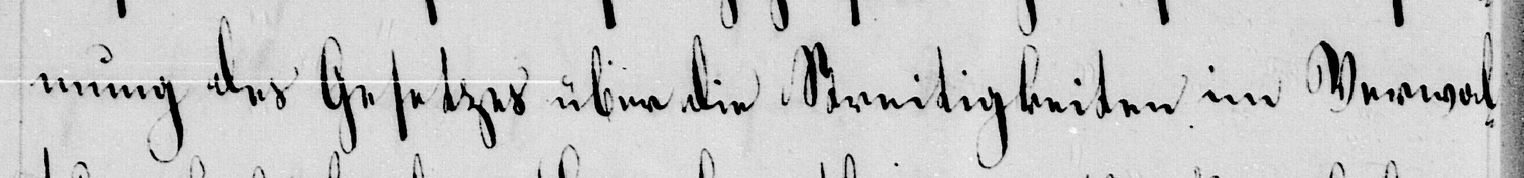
mung des Gesetzes über die Streitigkeiten im Verwal¬
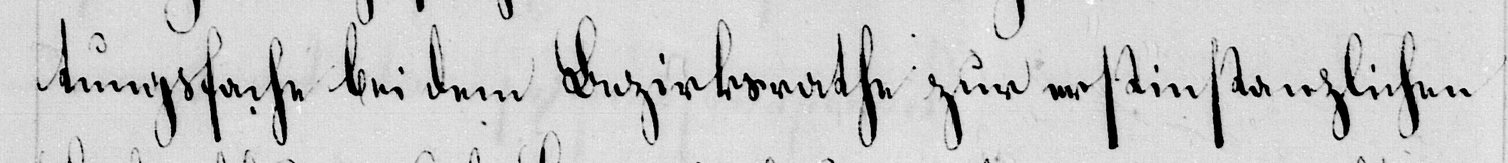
tungsfache bei dem Bezirksrathe zur erstinstanzlichen
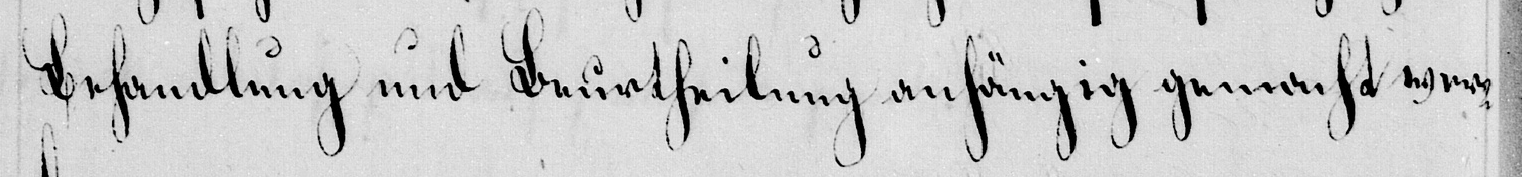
Behandlung und Beurtheilung anhängig gemacht wer¬
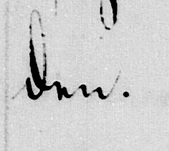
den.
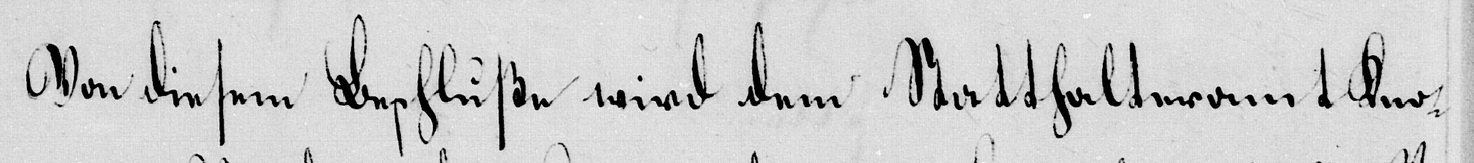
Von diesem Beschluße wird dem Statthalteramt Kno¬
